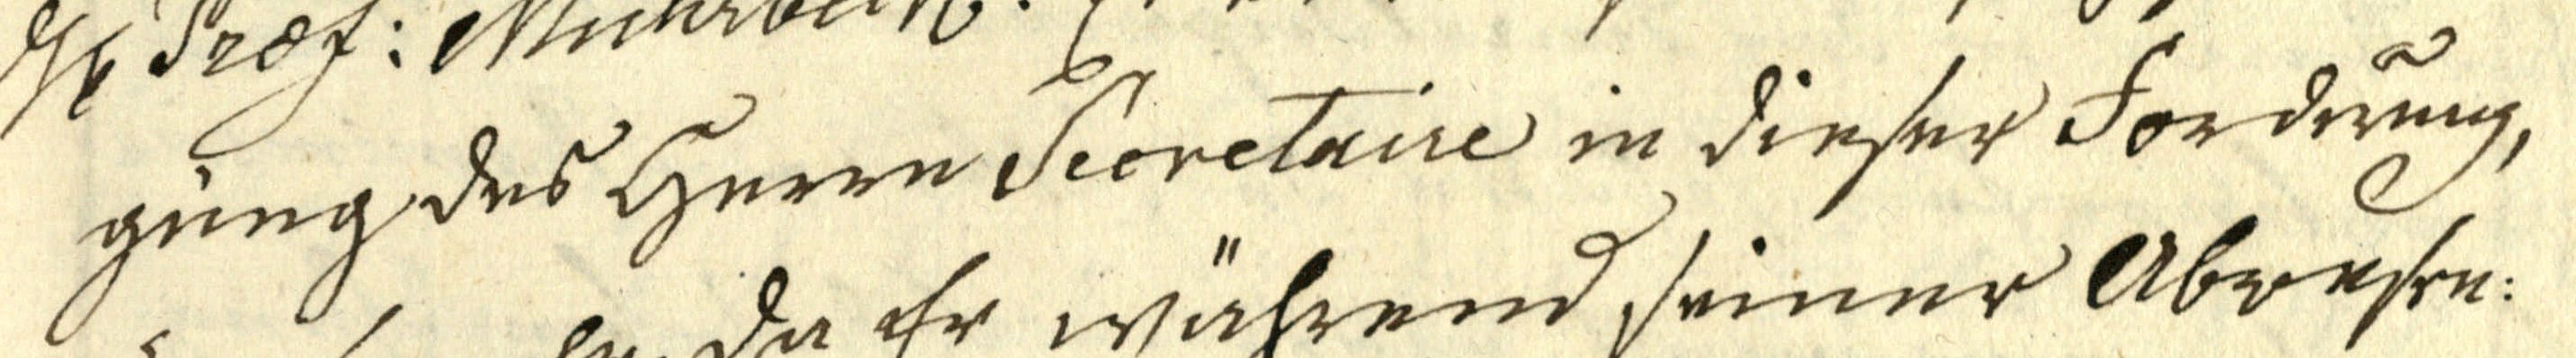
gung des Herrn Secretaire in dieser Forderung,
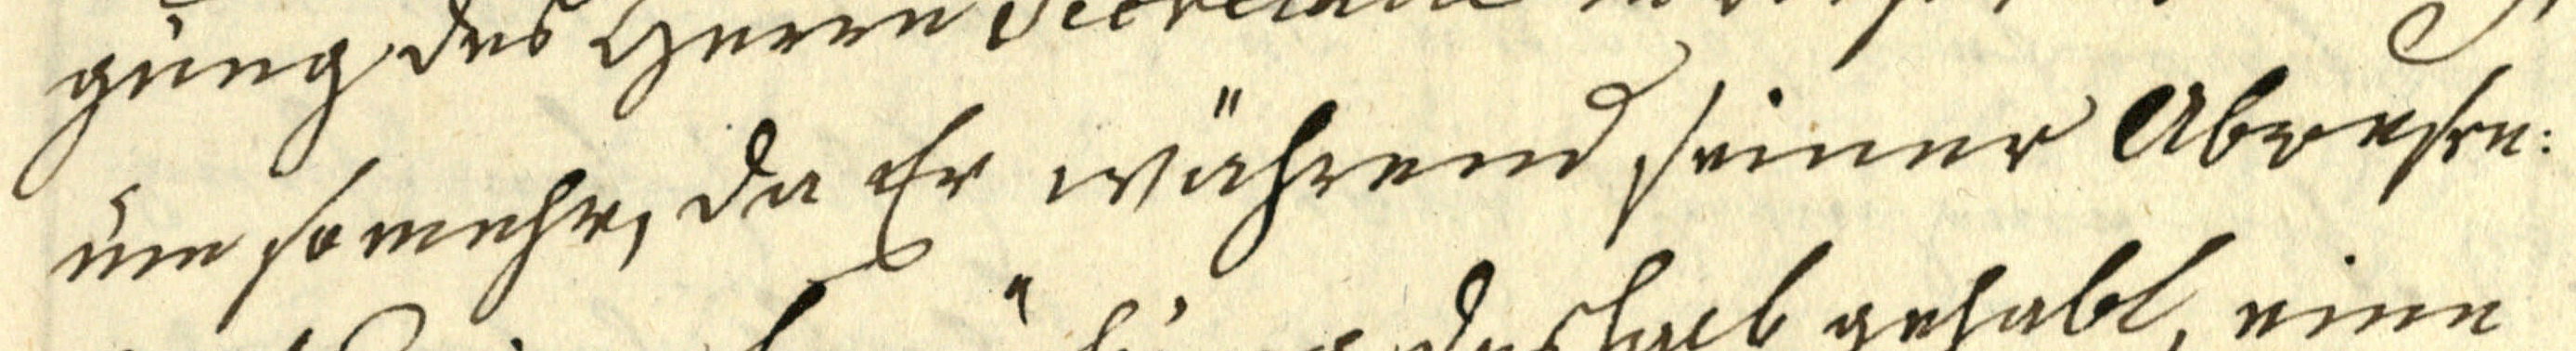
um so mehr, da Er während seiner Abwesen¬
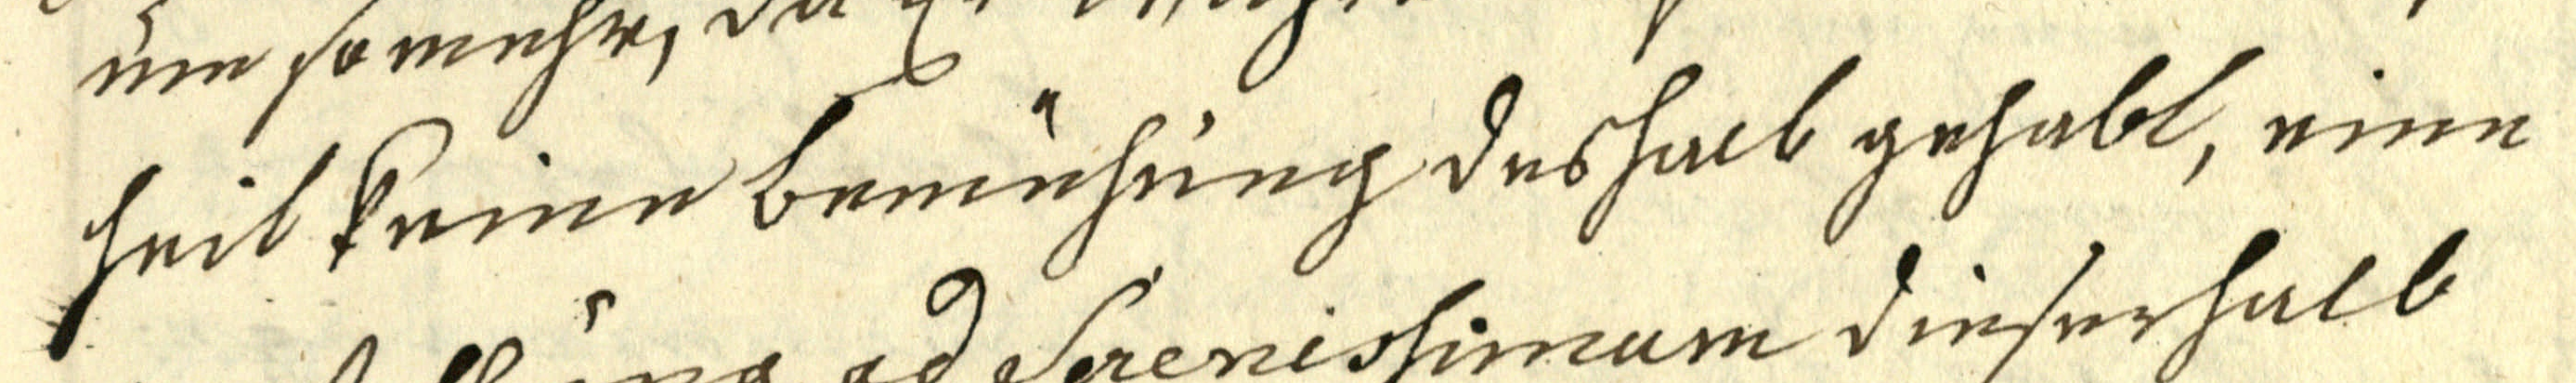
heit keine Bemühung deshalb gehabt, eine
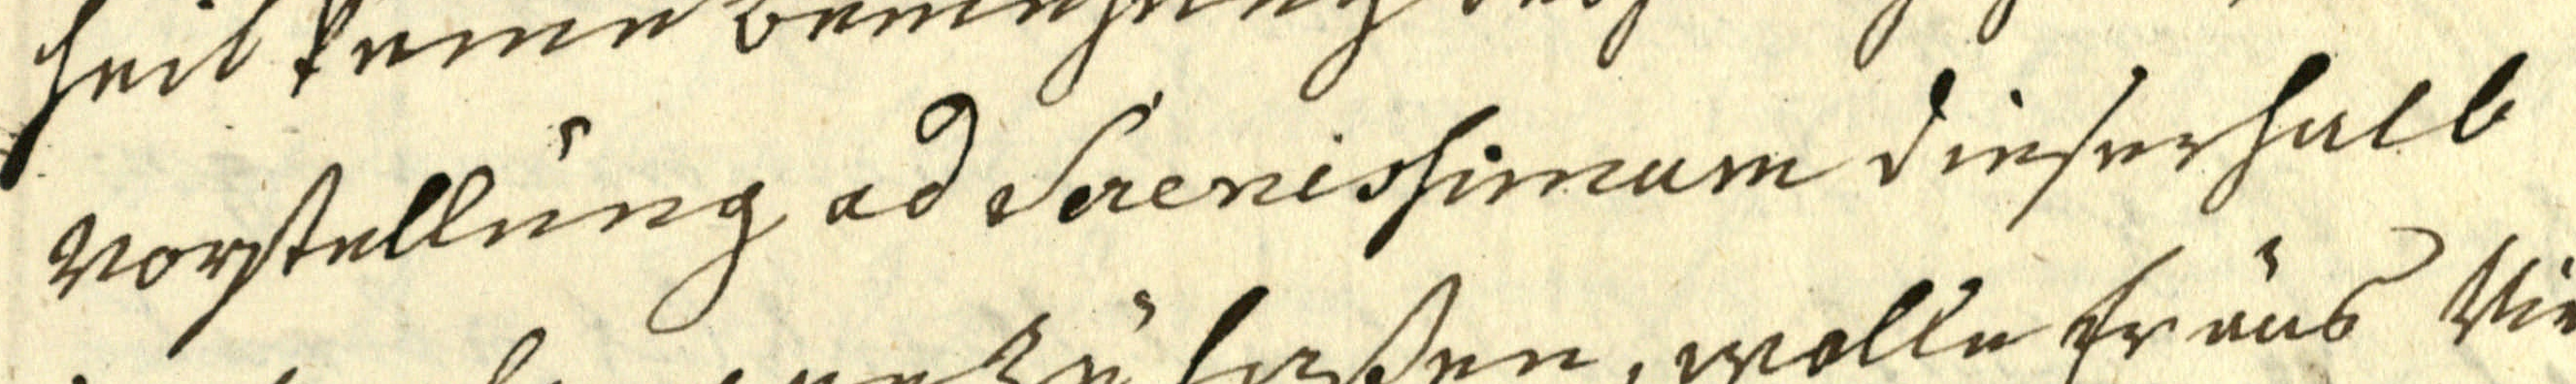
vorstellung ad Serenissimum dieserhalb
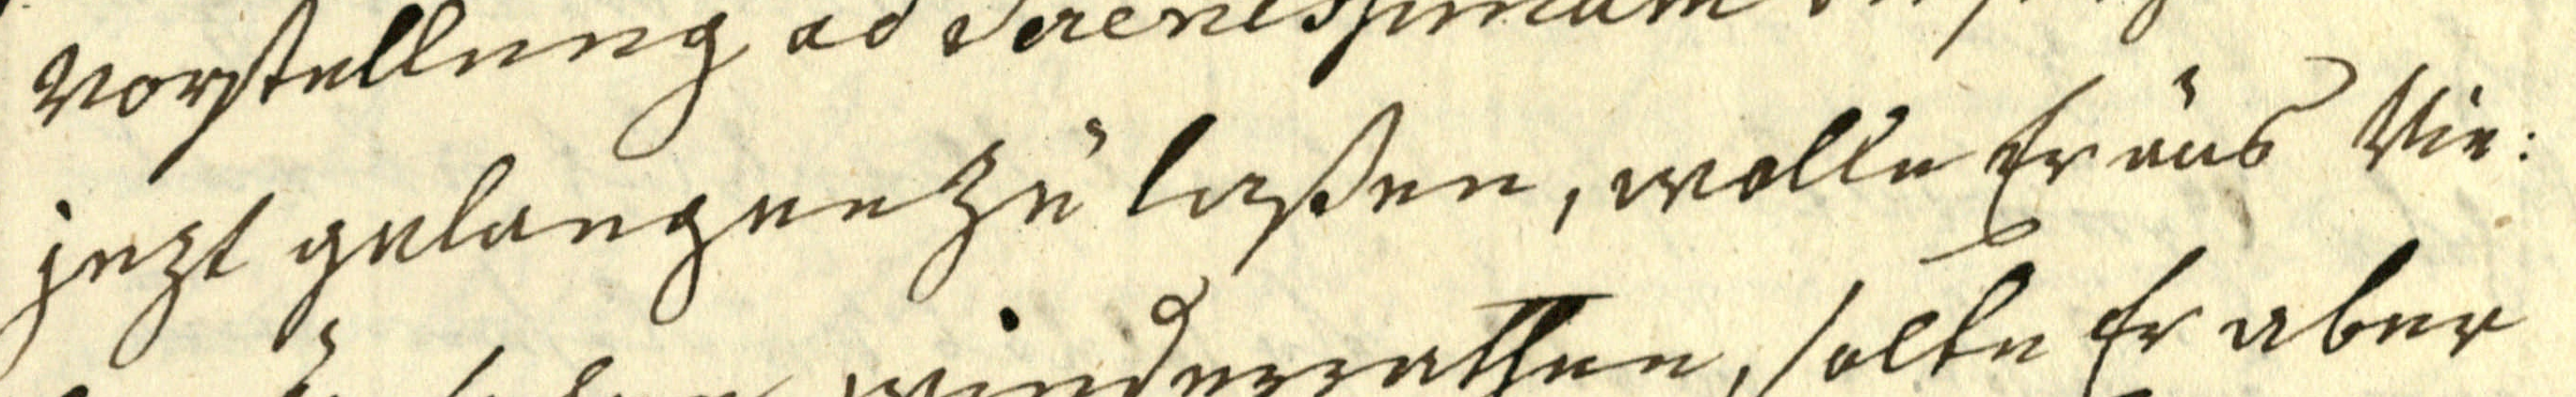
jezt gelangen zu laßen, wolle Er aus vie¬
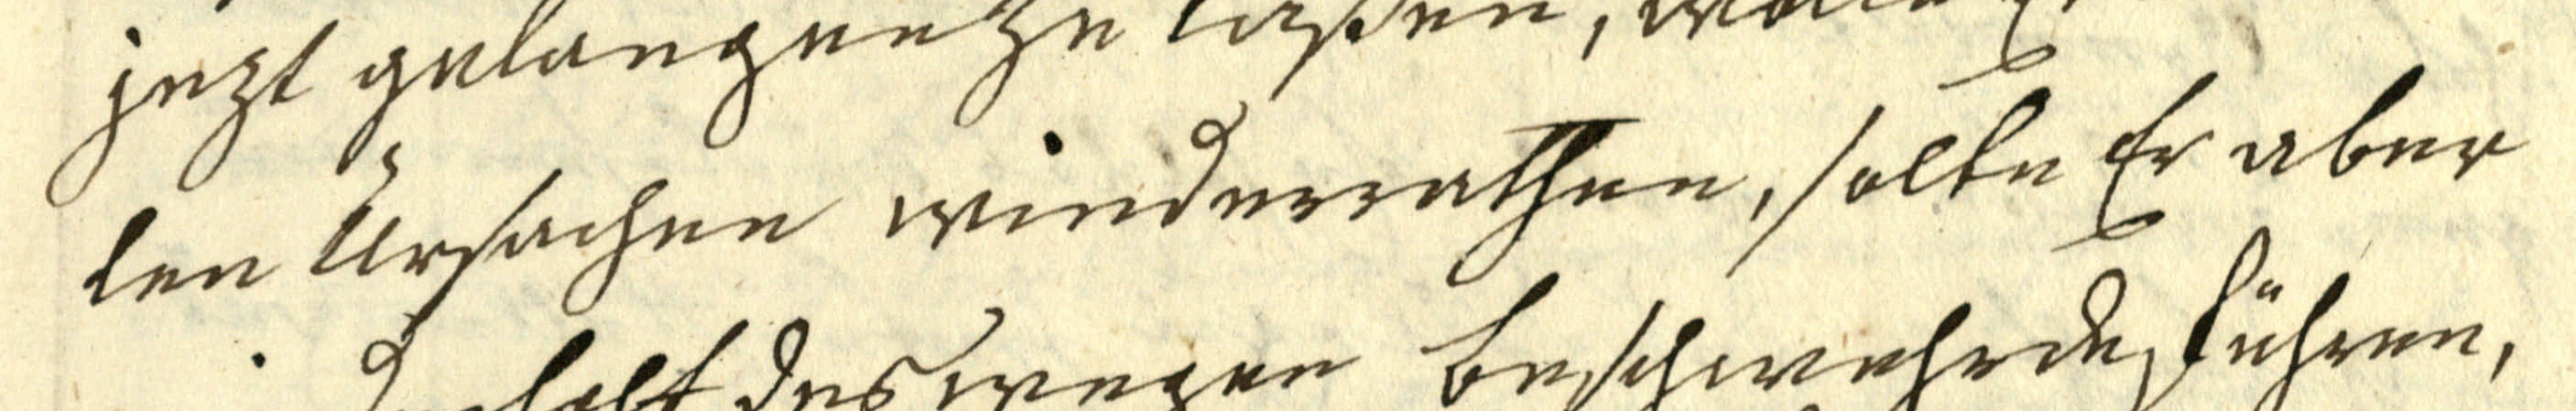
len Ursachen wiederrathen, solte Er aber
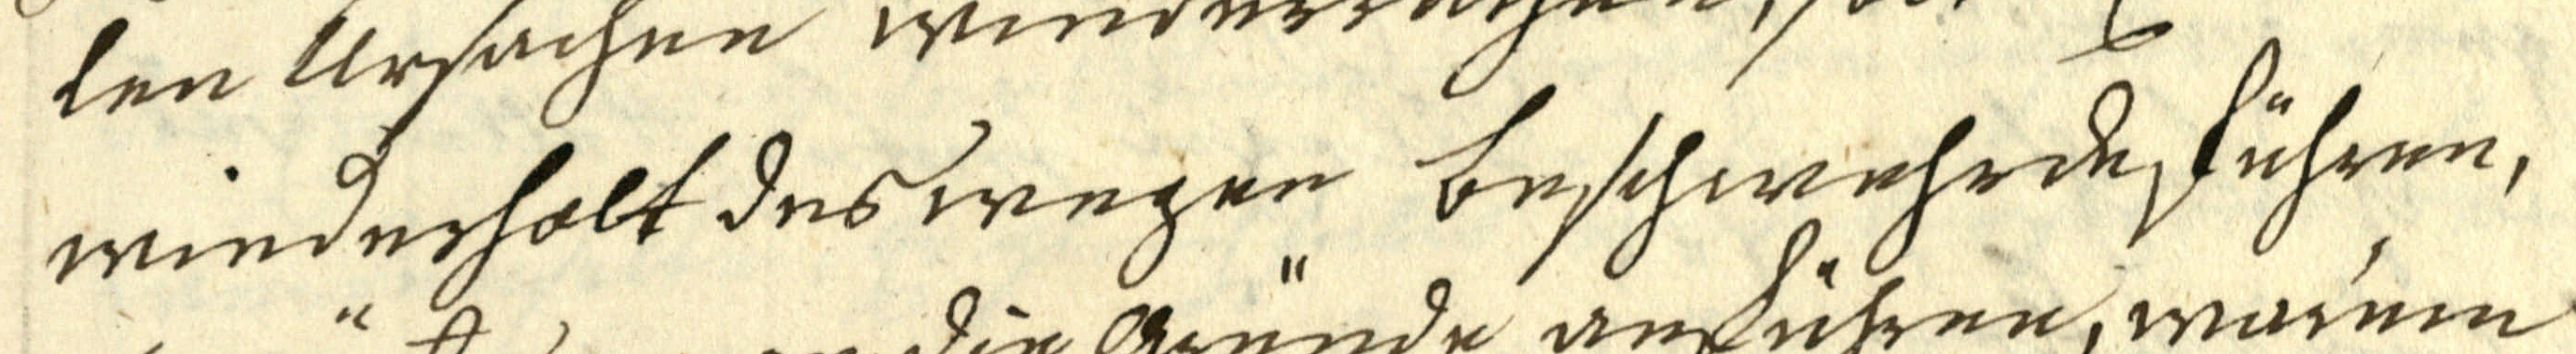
wiederholt deswegen Beschwehrdeführen,
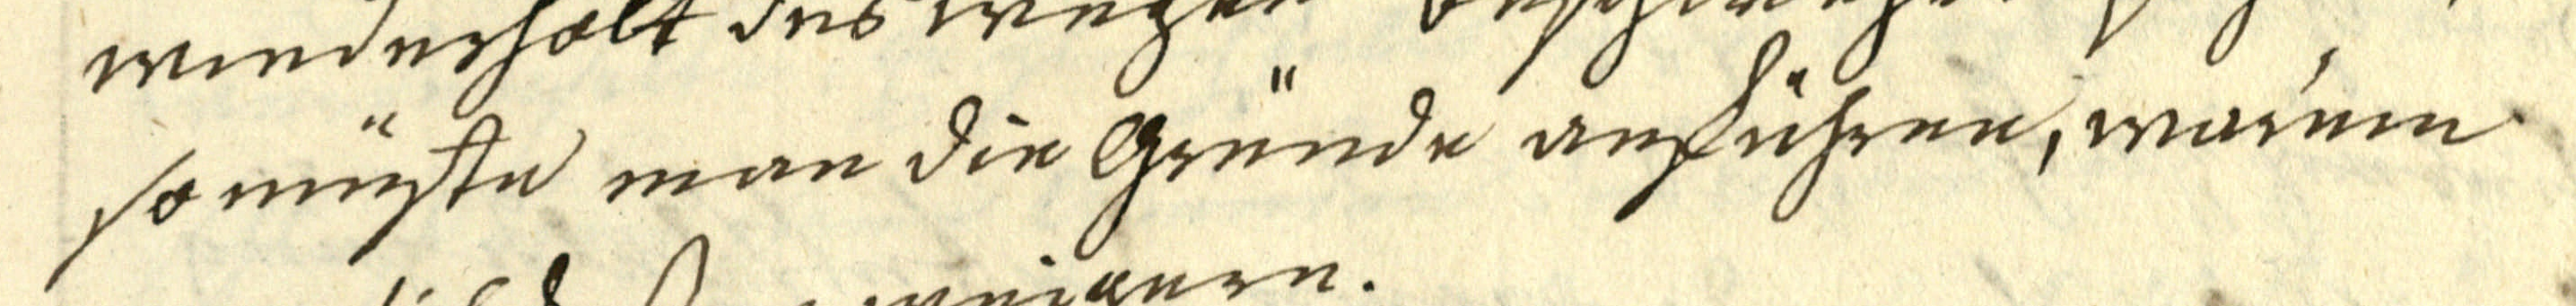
so müste man die Gründe anführen, warum
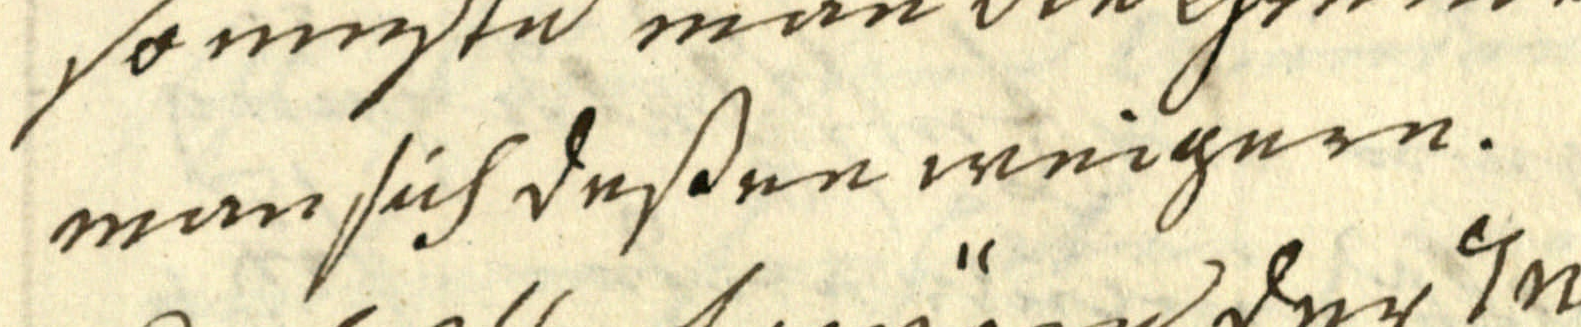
man sich deßen weigere.
